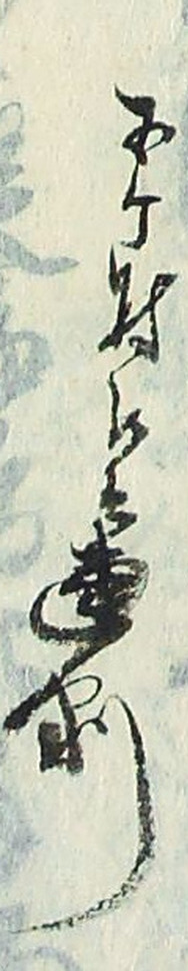五ケ村庄屋連判
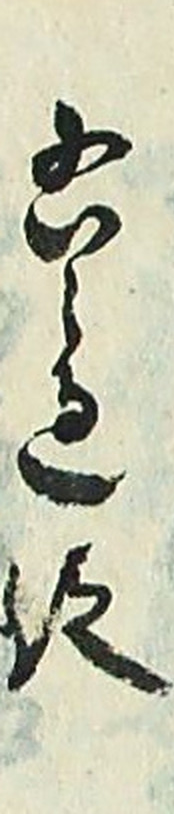右之通従
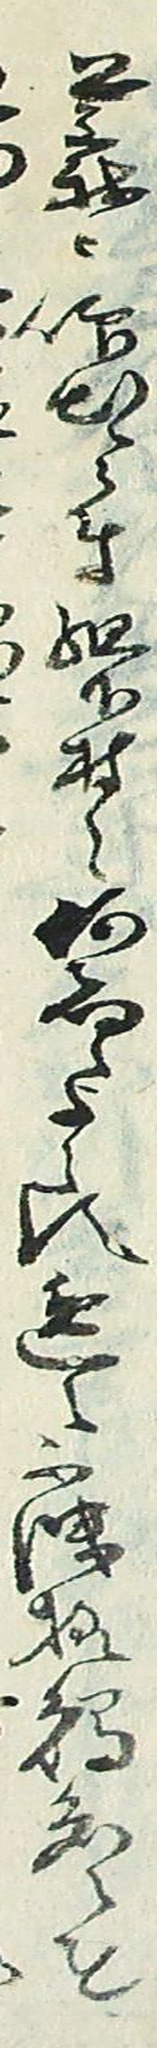公義被仰出候に付組下村々何者によらす逸々不洩様触知らせ
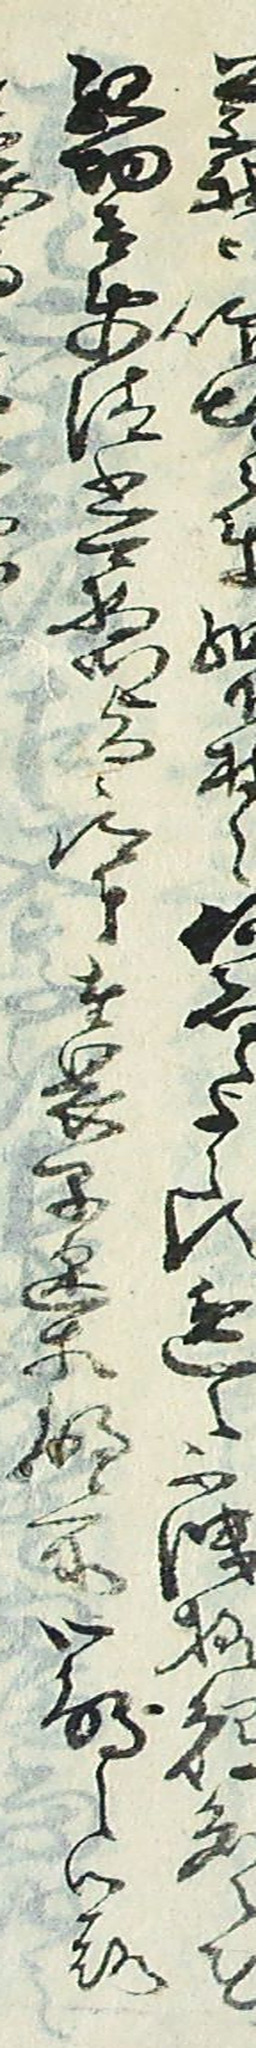組切壱帋請書可指出旨被仰付奉畏早速相触候所御触之御趣
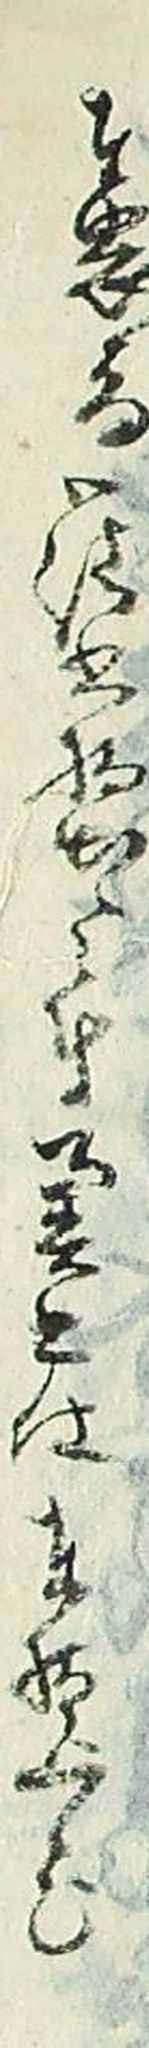奉畏旨御請書指出候に付奥書仕奉指上候以上

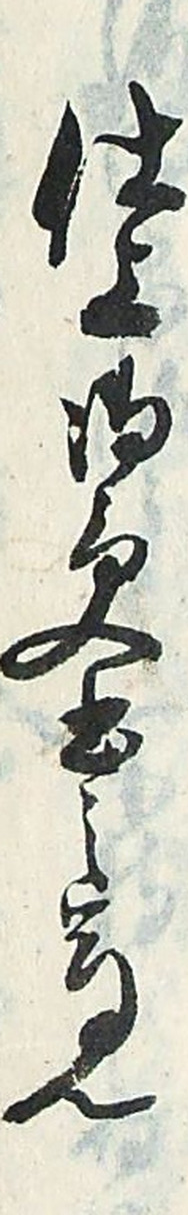仕上御受書之覚
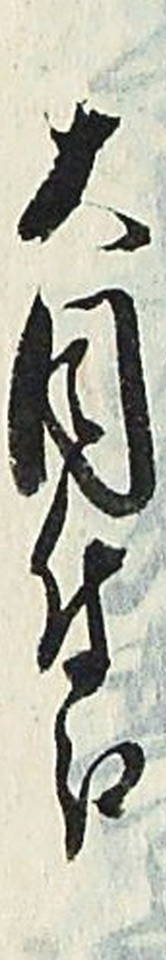大目付江
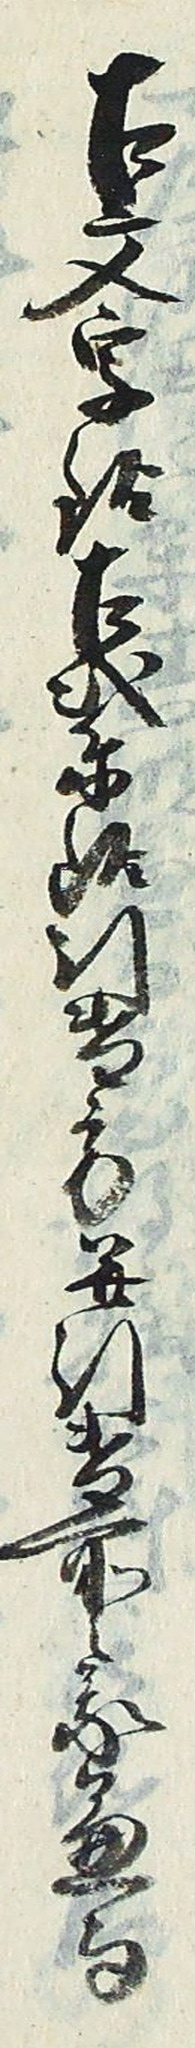古文字銀古弐朱銀引替方幷引替所之義兼て
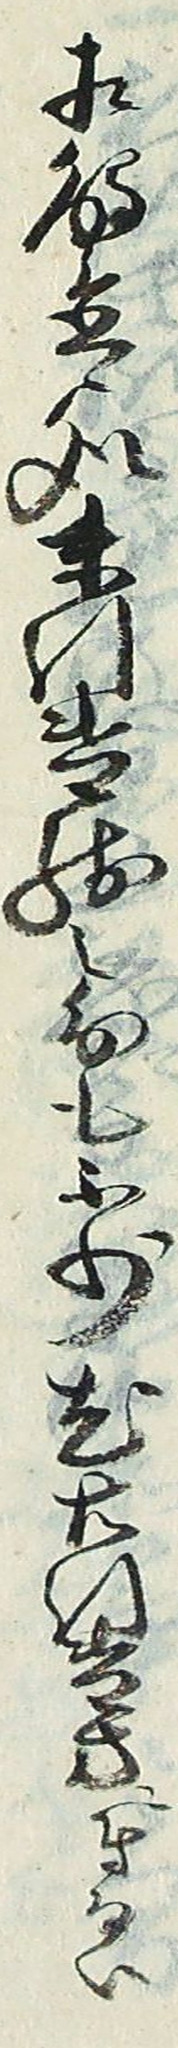相触置候処未引替残之分も不少尤右引替方に付ては
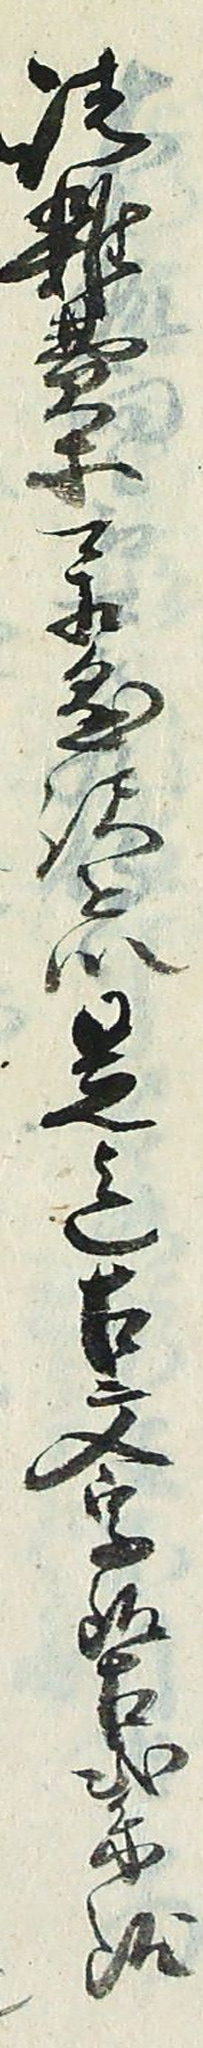諸雑費等可相懸訳を以是迄古文字銀古弐朱銀
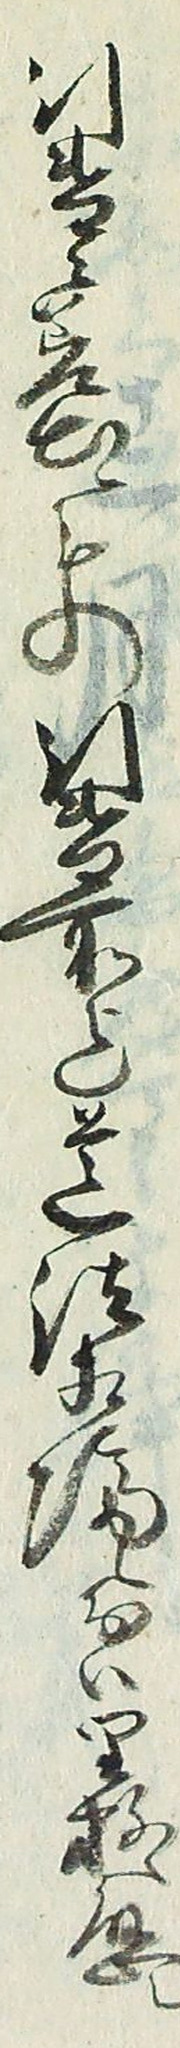引替に差出候もの引替所迄道法相隔候分は里数に応し
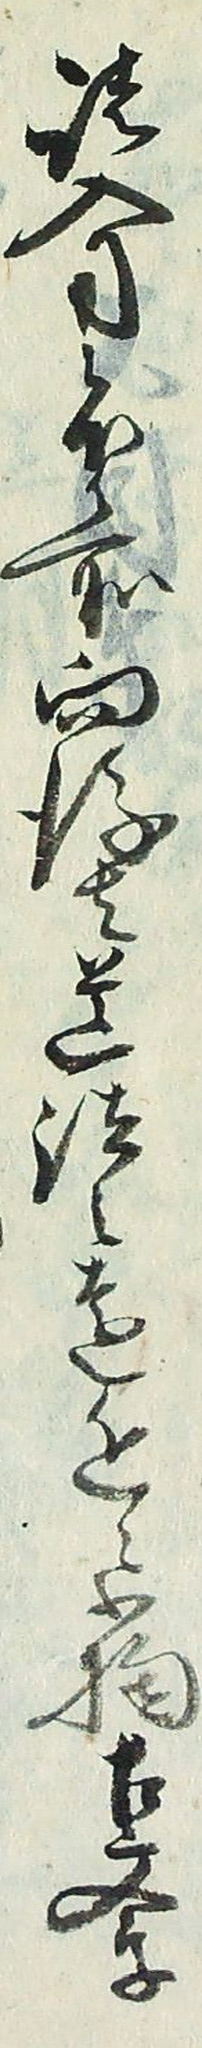諸入用被下候所向後は道法之遠近に不拘古文字
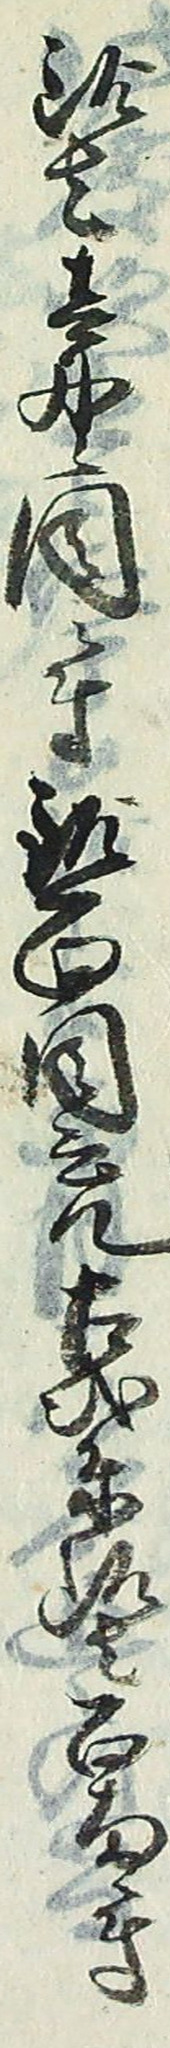銀は壱貫目に付銀百目充古弐朱銀は百両に付
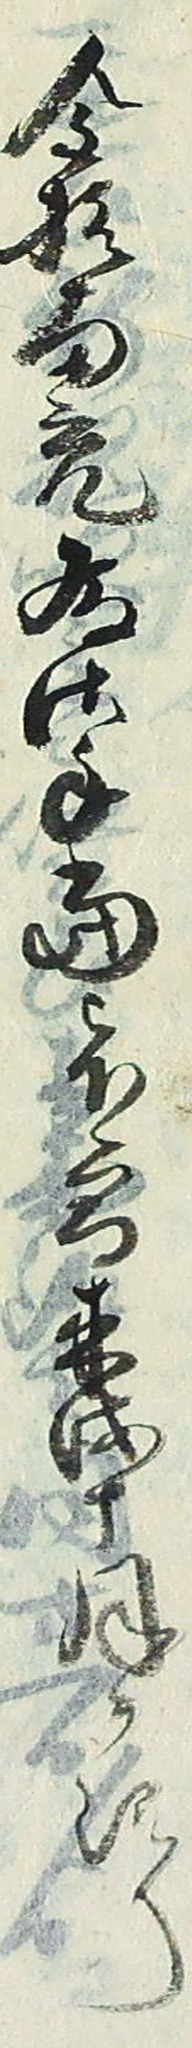金拾両充為御手当被下候間来戌十月を限り
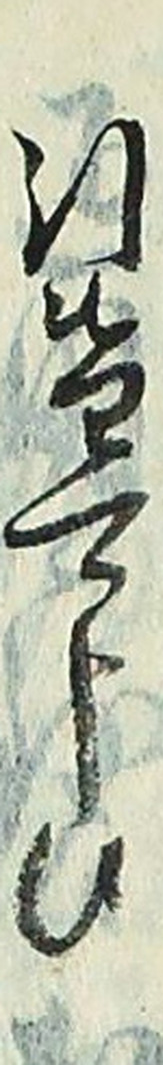引替可申候
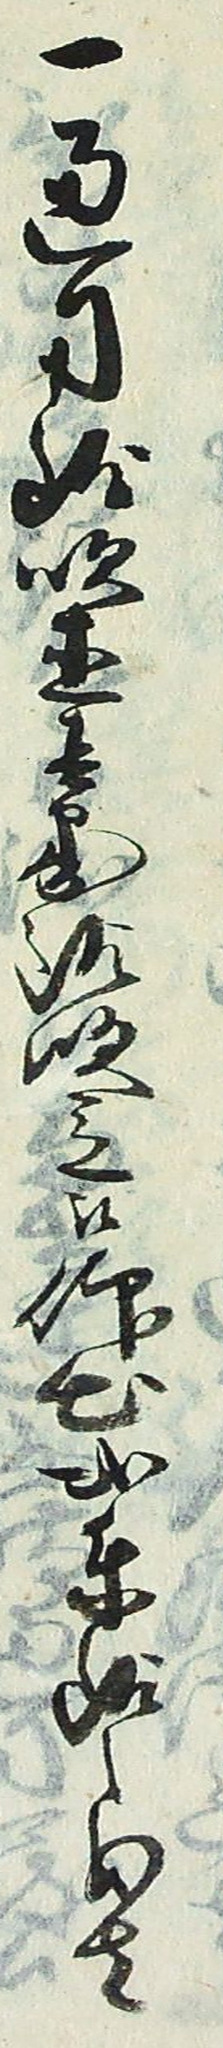一通用銀吹直壱歩銀吹立被仰出弐朱銀之義は
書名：諸御用御□受書控
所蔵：鳴門教育大学 Naruto University of Education
